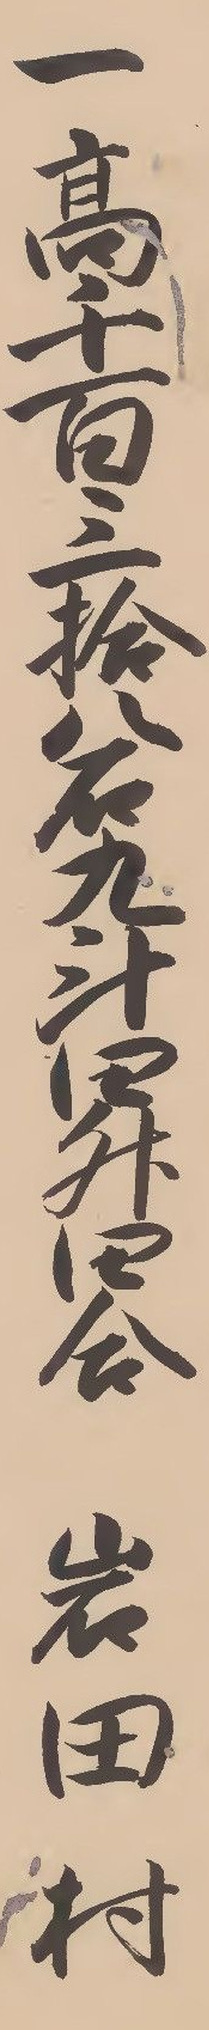一高千百三拾八石九斗四升四合岩田村
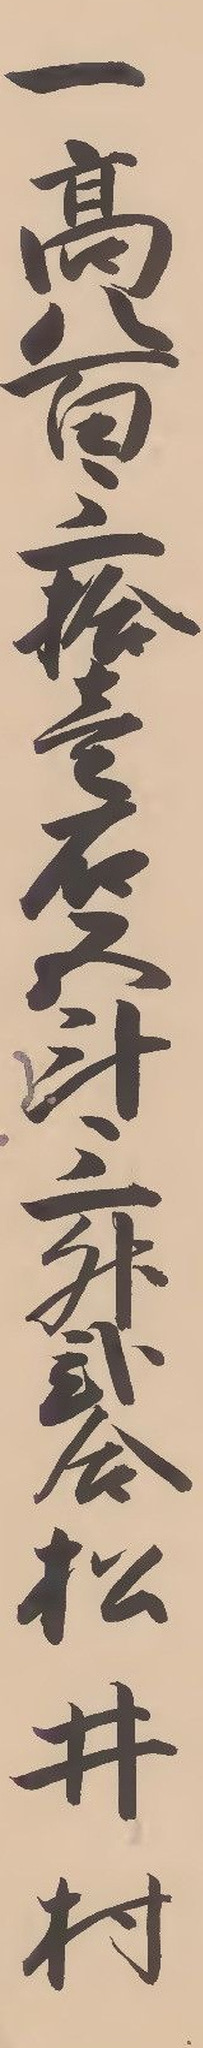一高八百三拾壱石五斗三升弐合松井村

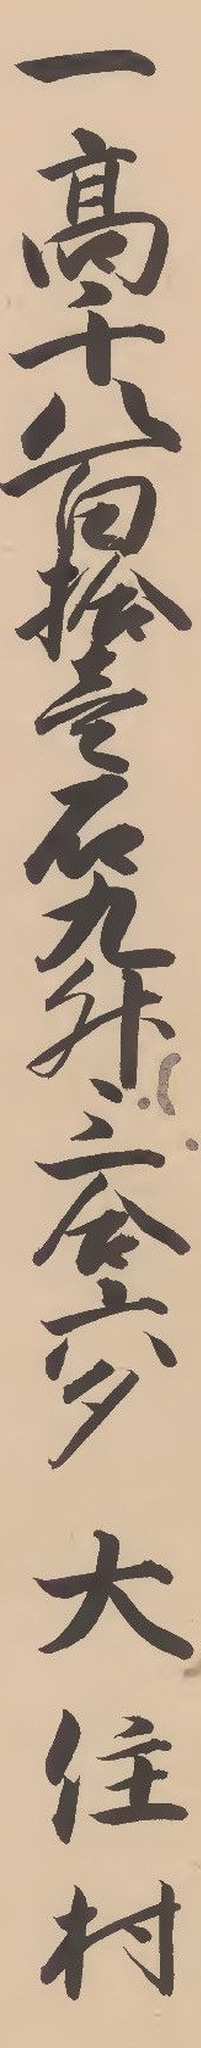一高千八百拾壱石九升三合六勺大住村
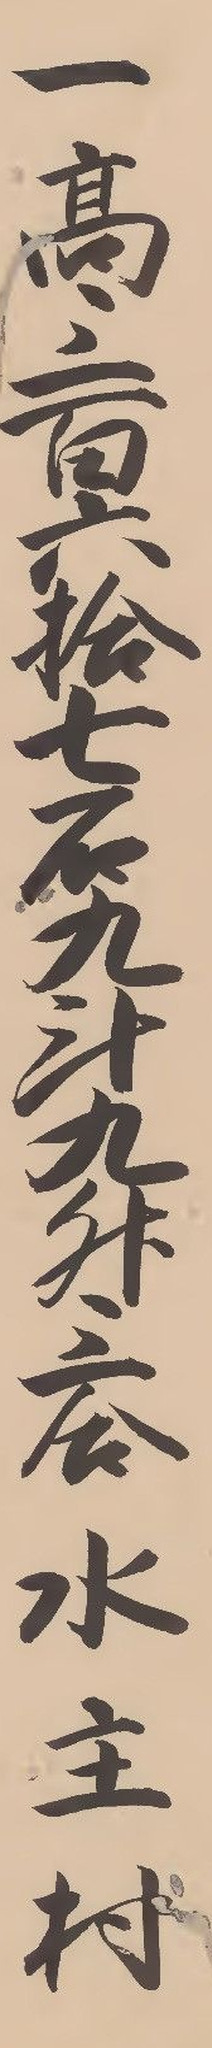一高三百六拾七石九斗九升三合水主村
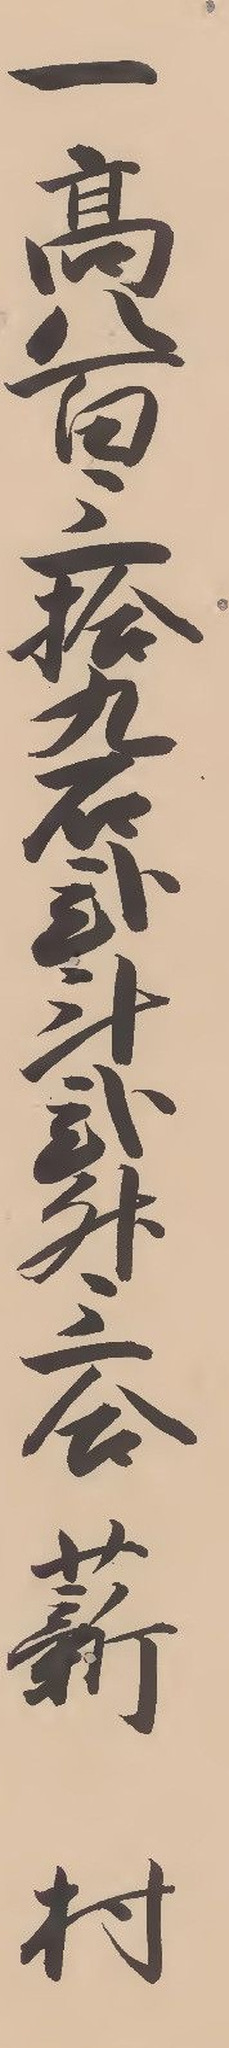一高八百三拾九石弐斗弐升三合薪村
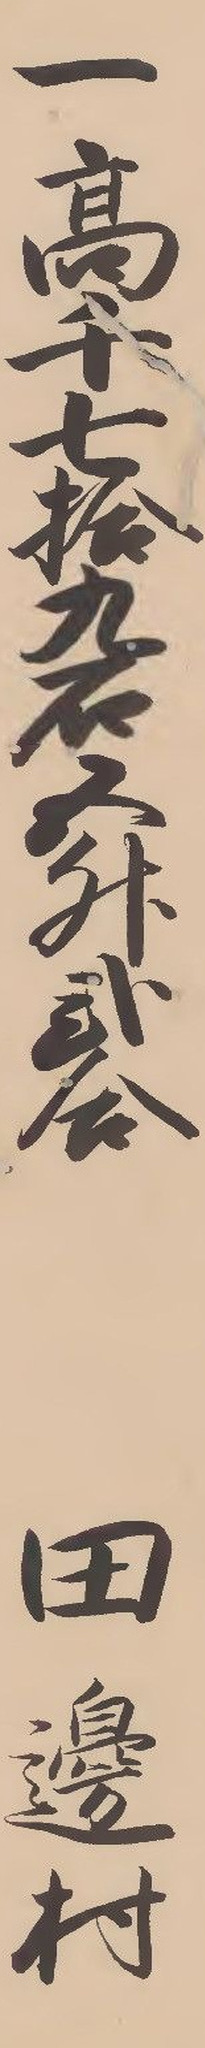一高千七拾九石五升弐合田辺村
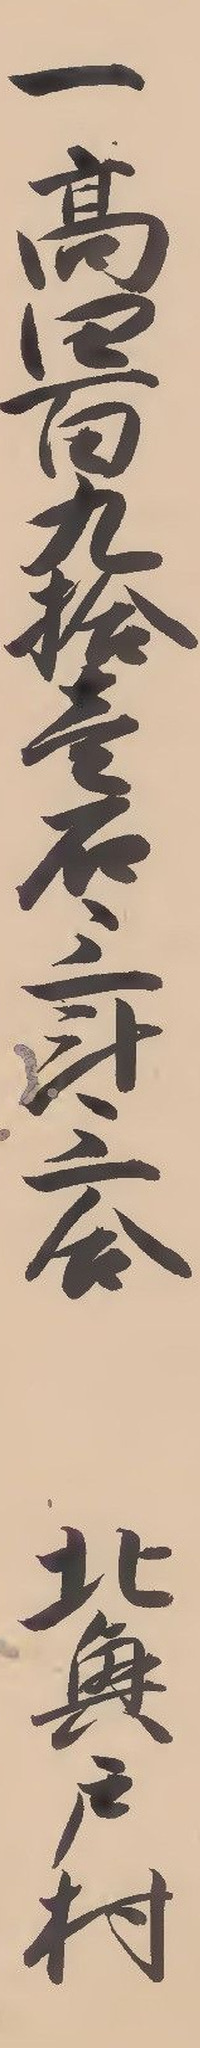一高四百九拾壱石三斗三合北興戸村

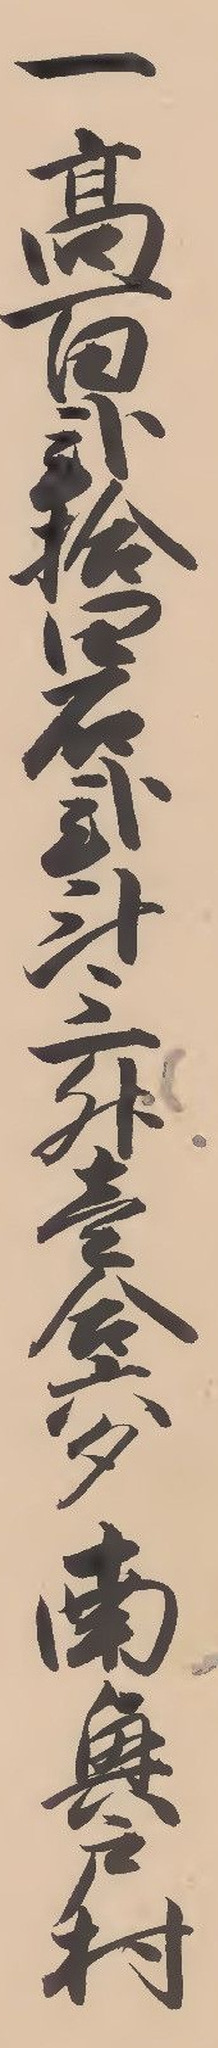一高百弐拾四石弐斗三升壱合六勺南興戸村
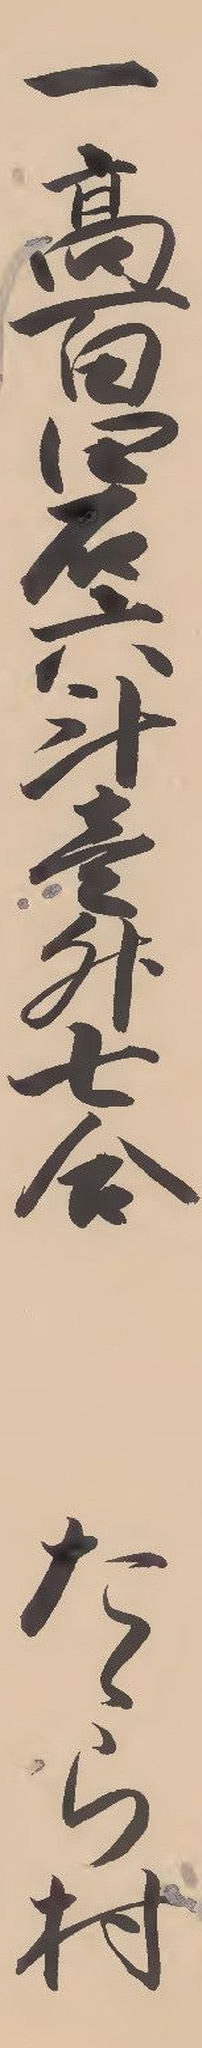一高百四石六斗壱升七合たゝら村
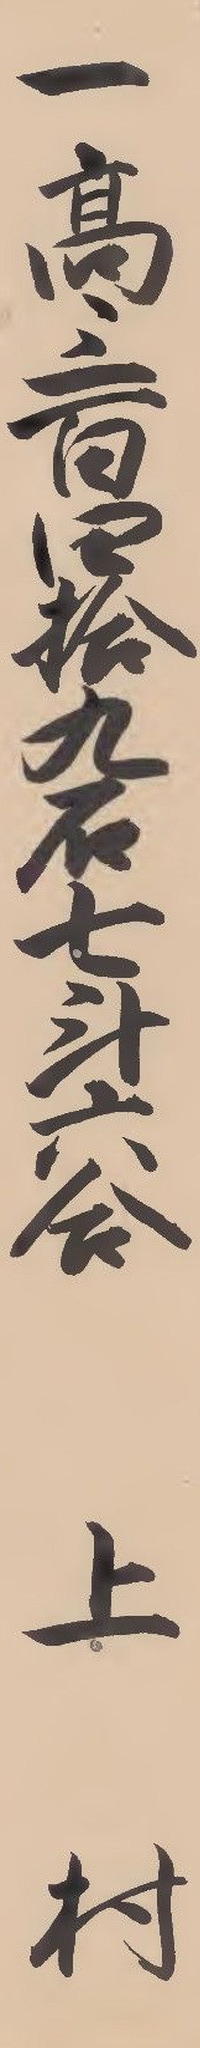一高三百四拾九石七斗六合上村
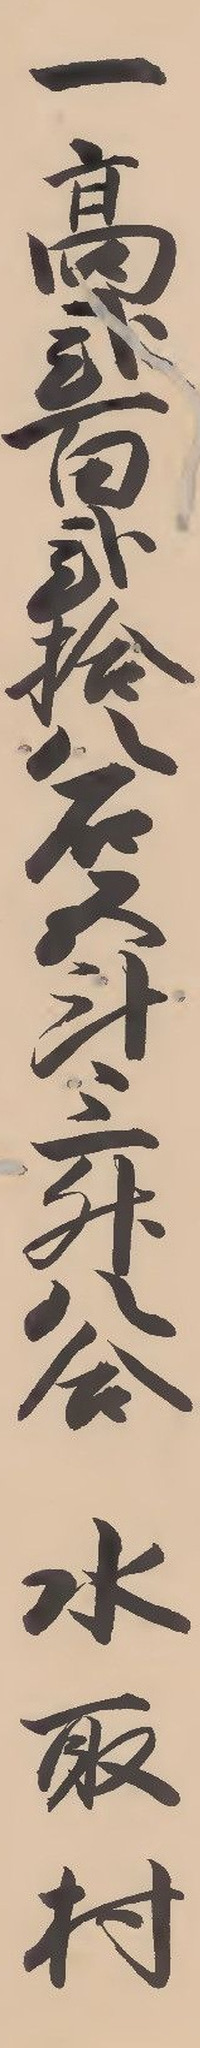一高弐百弐拾八石五斗三升八合水取村
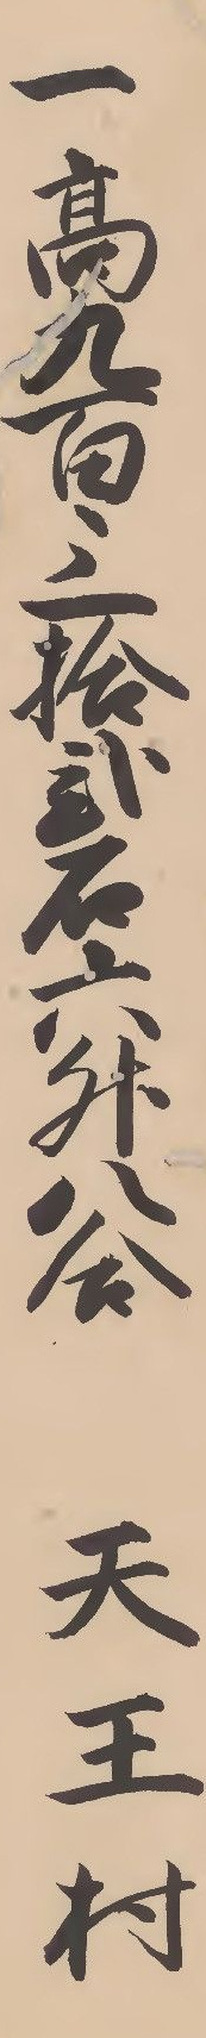一高九百三拾弐石六升八合天王村
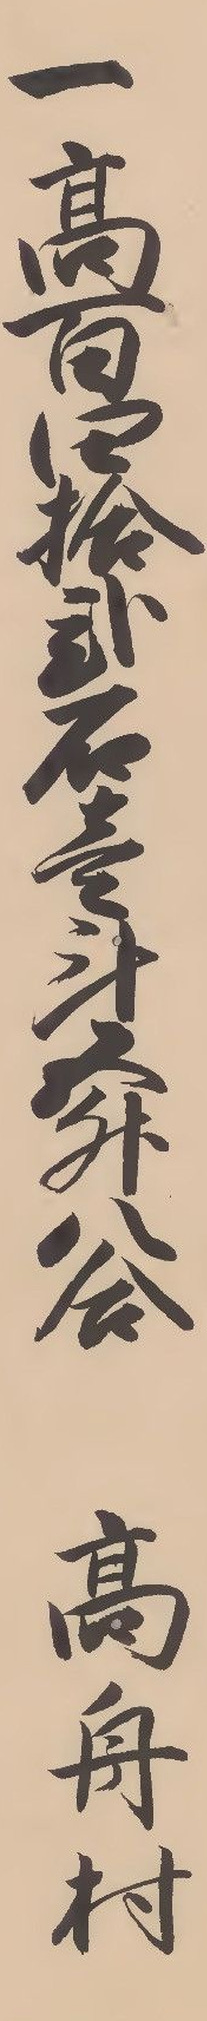一高百四拾弐石壱斗五升八合高舟村
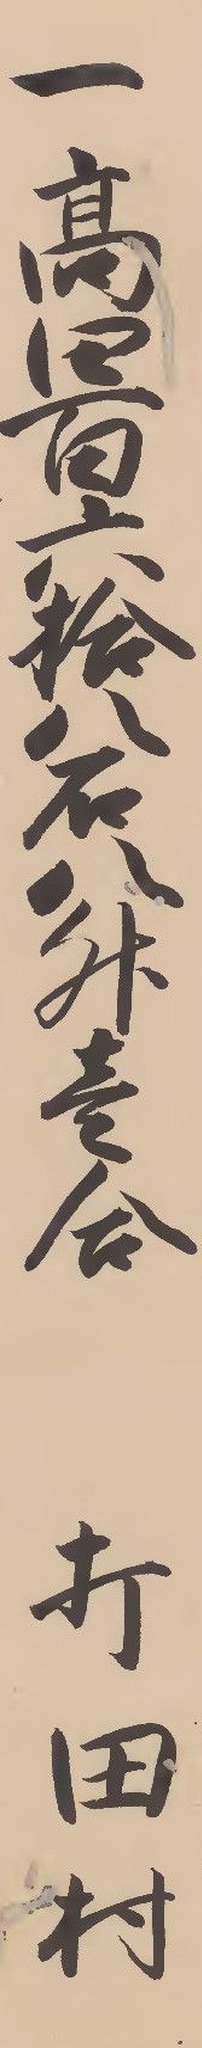一高四百六拾八石八升壱合打田村
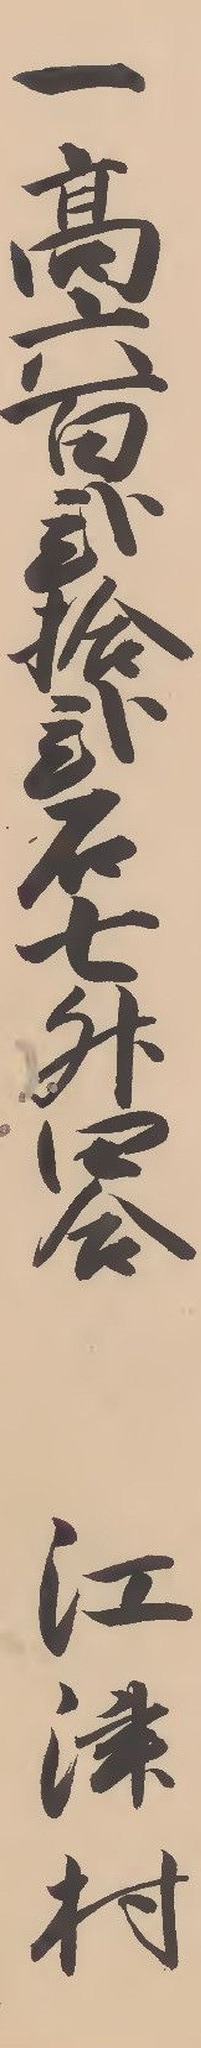一高六百弐拾弐石七升四合江津村

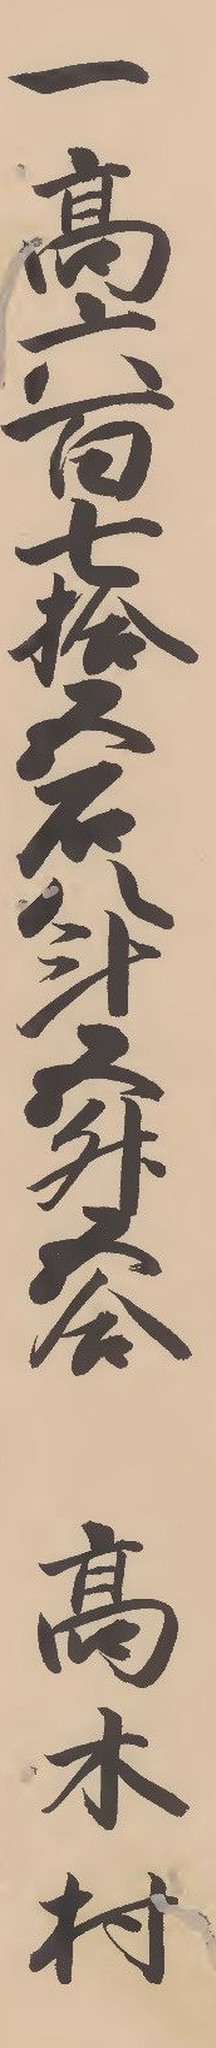一高六百七拾五石八斗五升五合高木村
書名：山城国郷帳
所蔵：国立公文書館 National Archives of Japan
